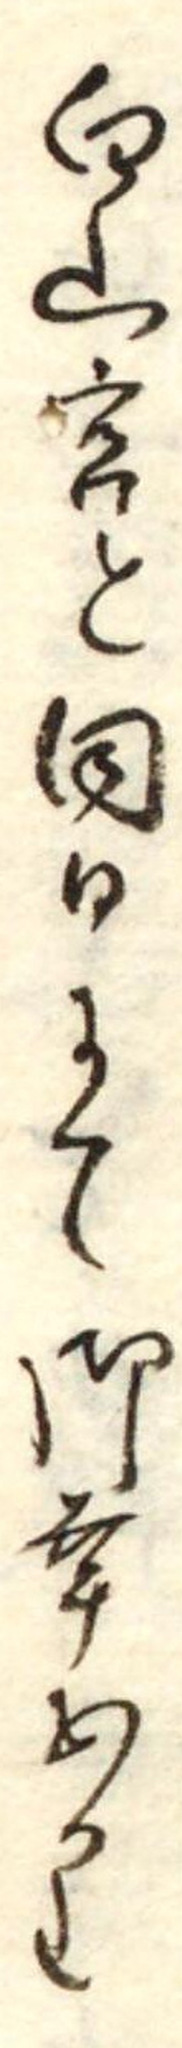白山宮と同日にて御幸あり
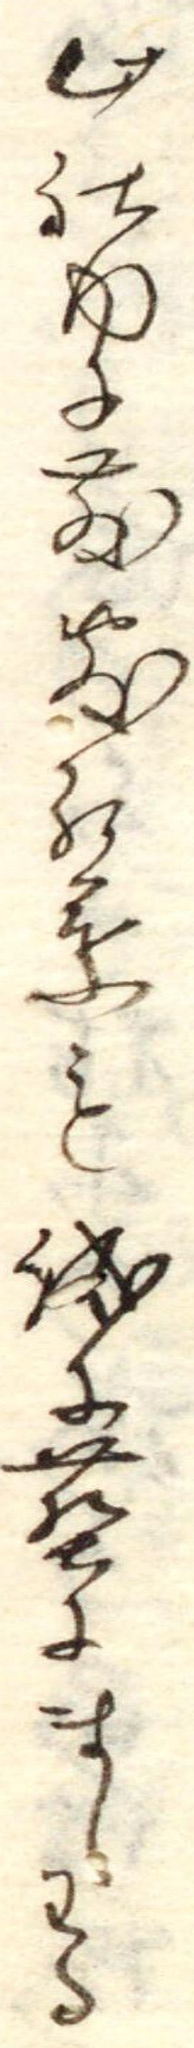此社内に散敷紅葉も誠に芸にましわる
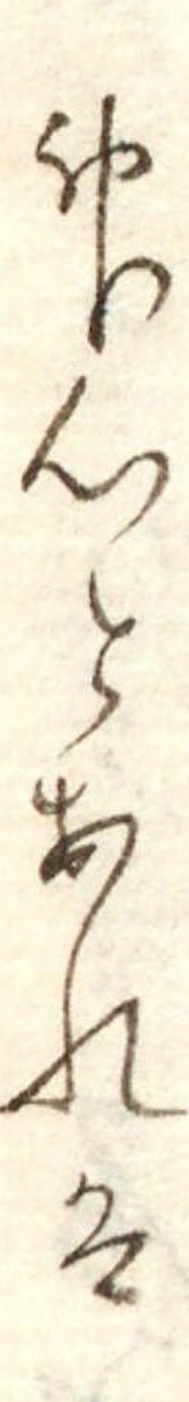神心とあれは
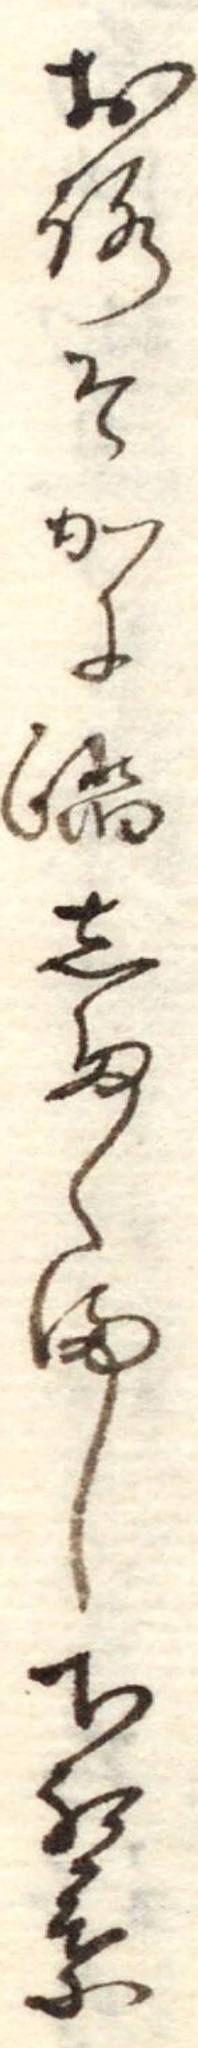おろそかに踏したくまし下紅葉
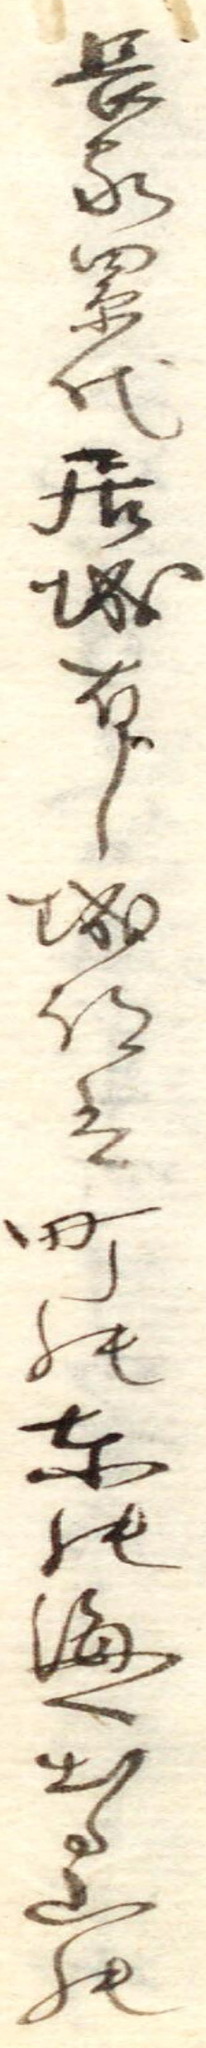長家累代居城有し城跡は町の東の海へ出る山の
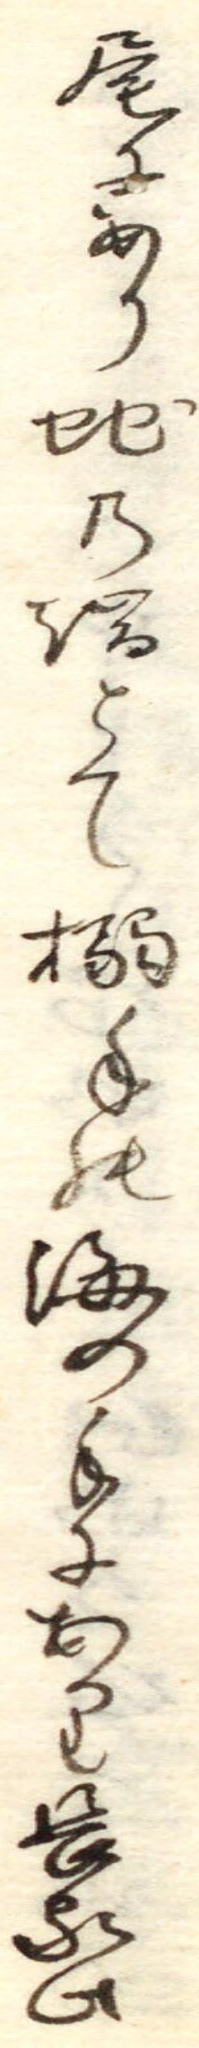尾にあり地の端とて搦手の海の手にあり長家此
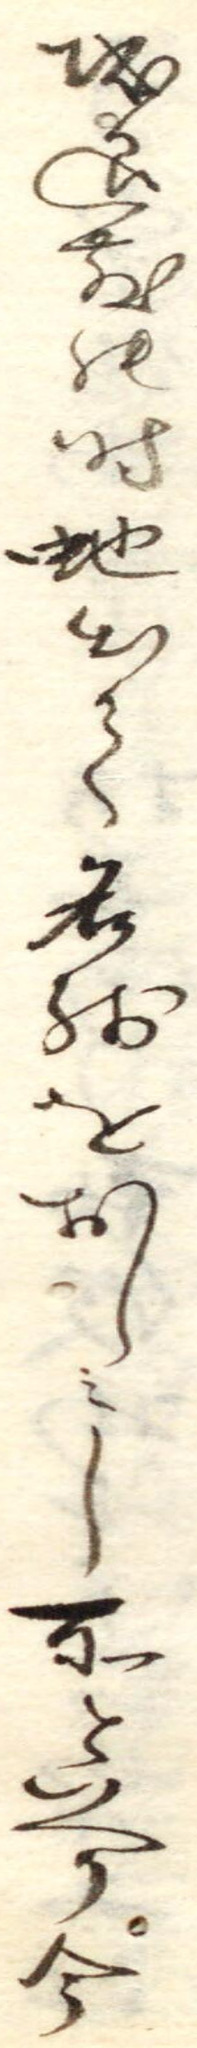城退散の時虵出て名残をおしみし所といへり今
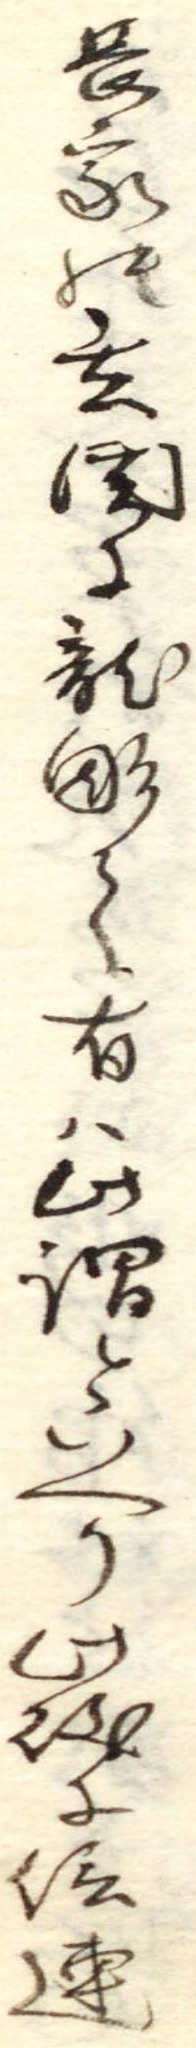長家の玄関に龍彫て有は此謂といへり此礒に信連
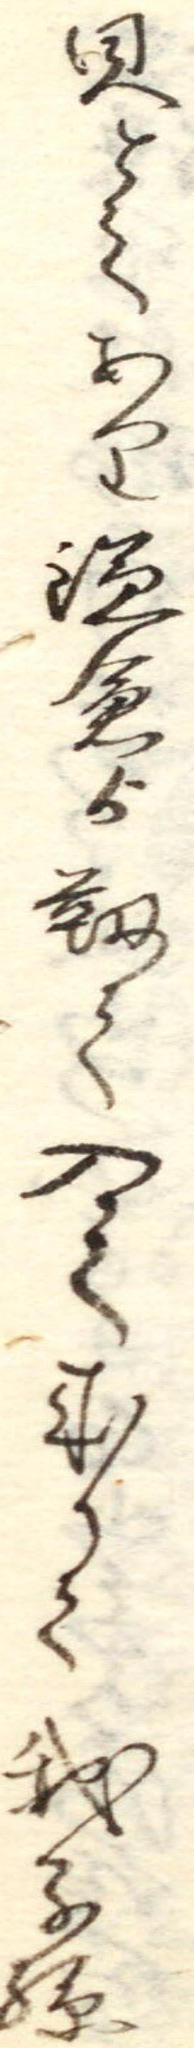貝とてあり鎌倉ゟ靭て入て来りて我子孫
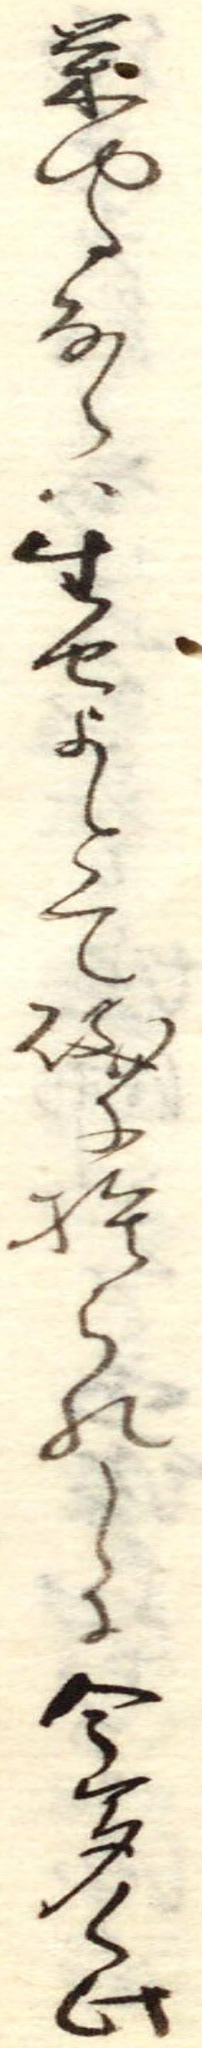栄ゆるならは生せよとて礒に捨られしに今多く此
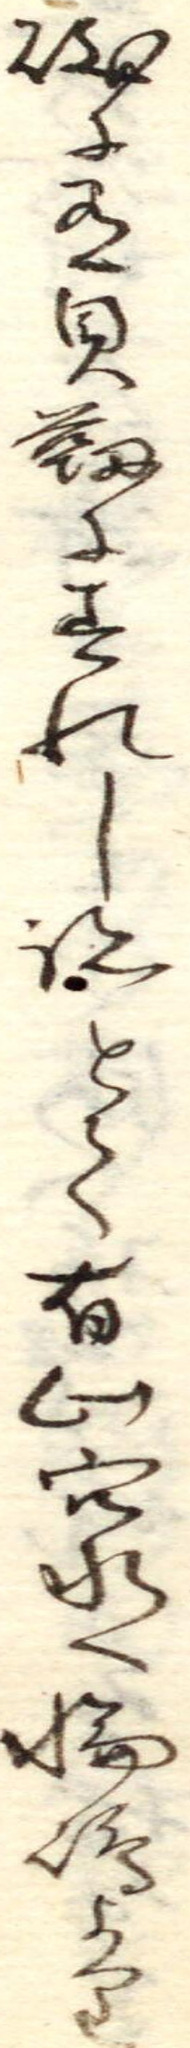礒に有貝靭にすれし跡とて有此穴水へ輪嶋より
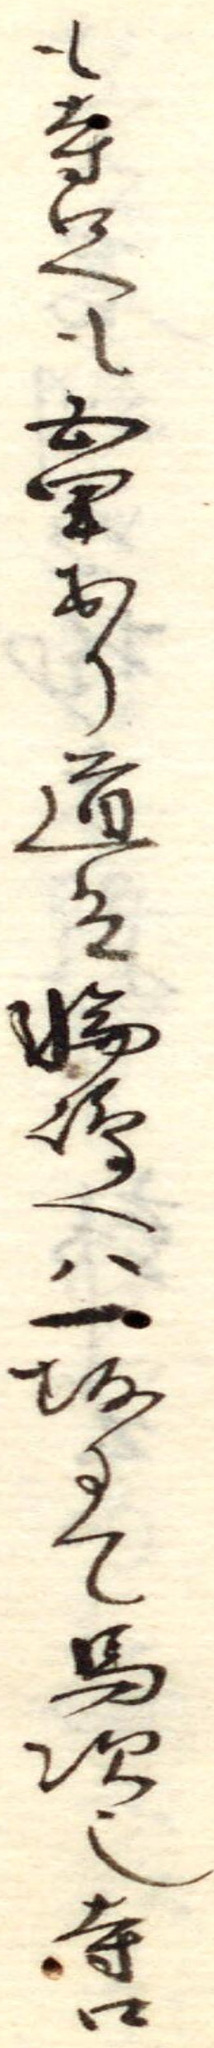も寺口へも五里あり道は輪嶋へは一坂にて馬次也寺口
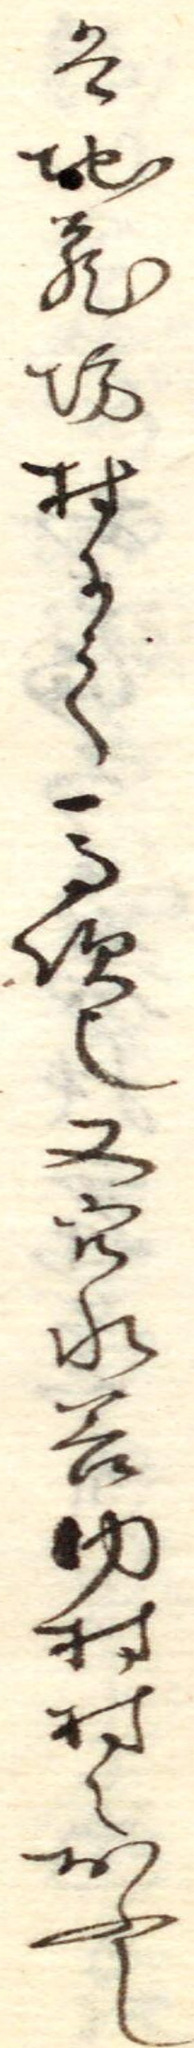は地蔵坊村にて馬次也又穴水谷内村村々おふし
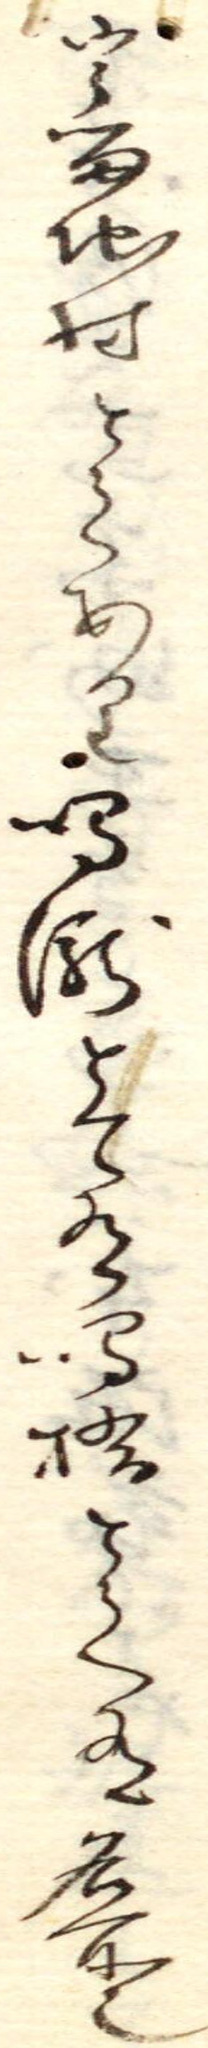宇留地村とてあり鳴瀧とて有鳴橋とて有名所也
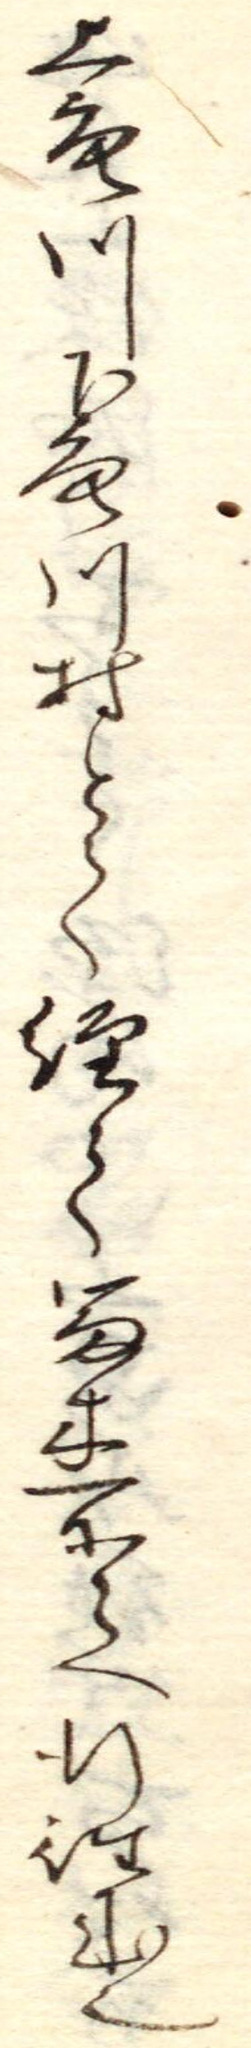上唐川下唐川村とて経て留木所々へ行往来也
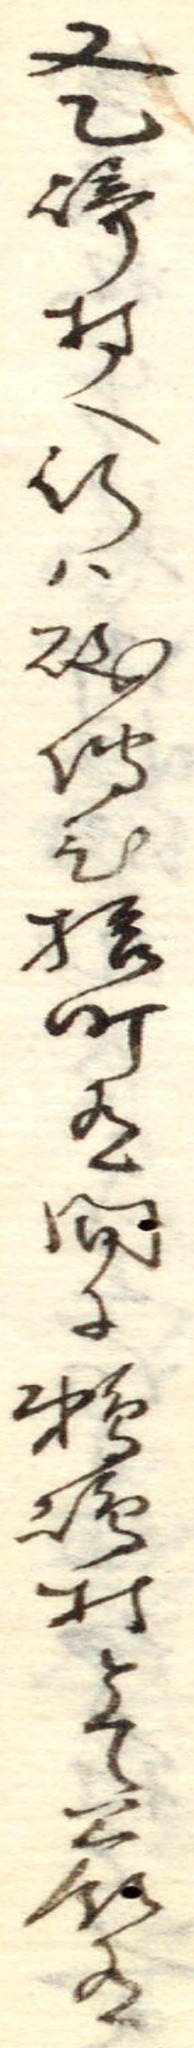又乙崎村へ行は礒伝ひ拾町有間に鵜嶋村とて公領有
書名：能登名跡誌
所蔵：Ishikawa Prefectural Library
